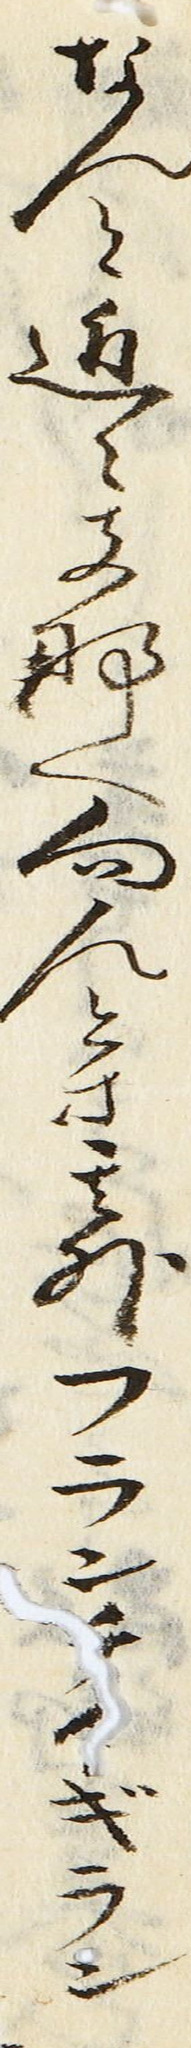なんと近々支那へ向んとす其外フランチイギラン
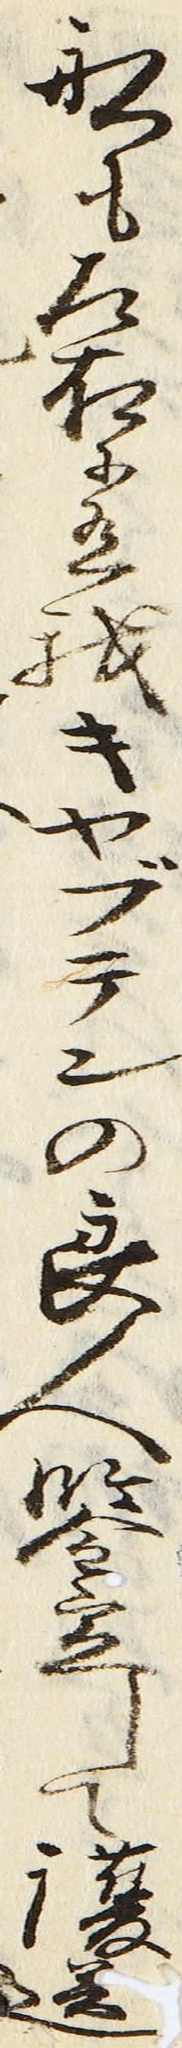船も左右に有我キヤブテンの良人鑑定して護送
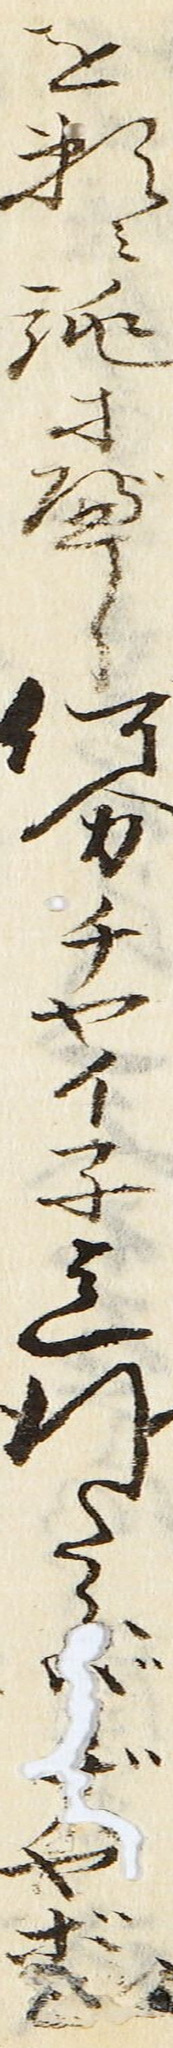を頼ミ誂すべし何分チヤイネ迄行たらバヂヤボ
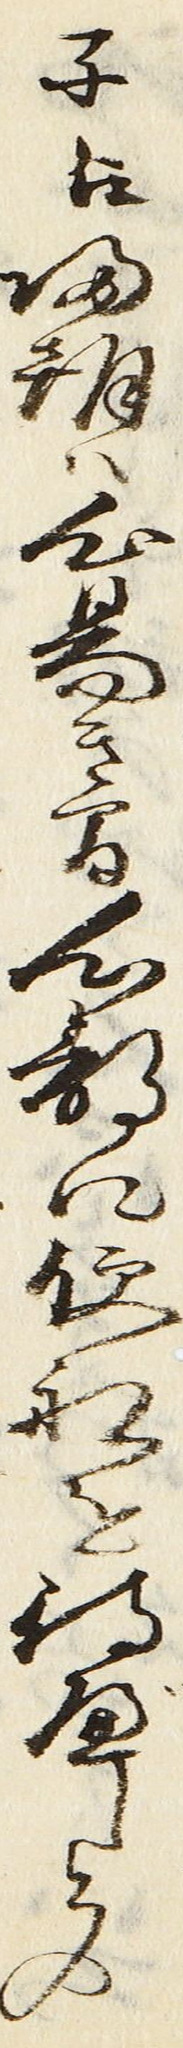ネ江帰朝ハ心易き間心静に便船を待べしとの
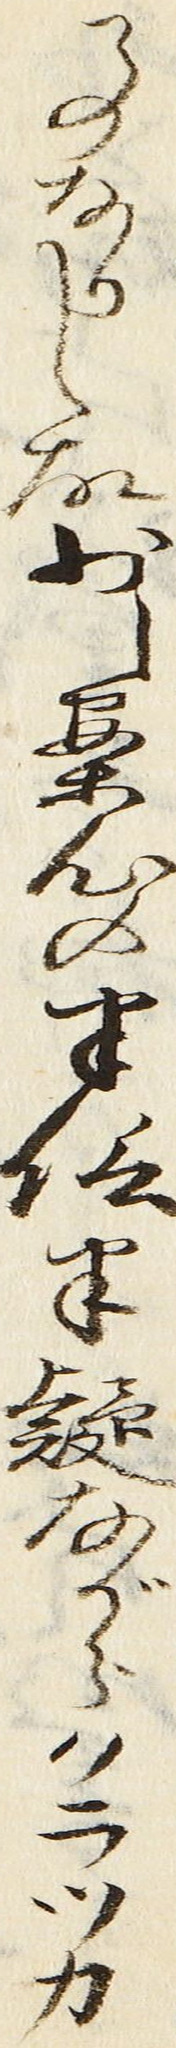事なりし故少し案心の半信半疑ながらクラツカ
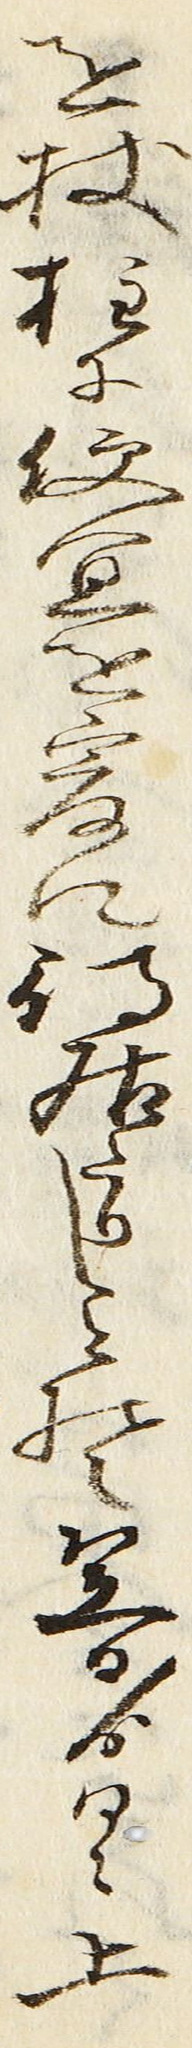を杖柱に便宜を爰に待居たりしとそ翌日ゟ日々上
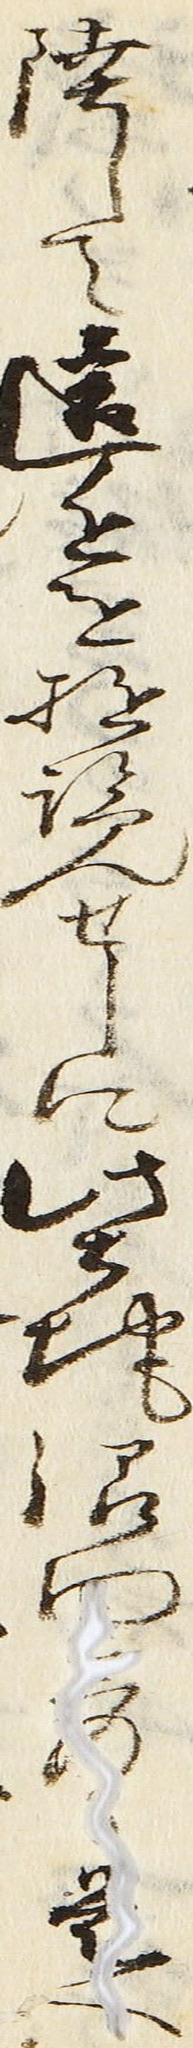陸して遠近を遊覧せしに此土地沼田是へ
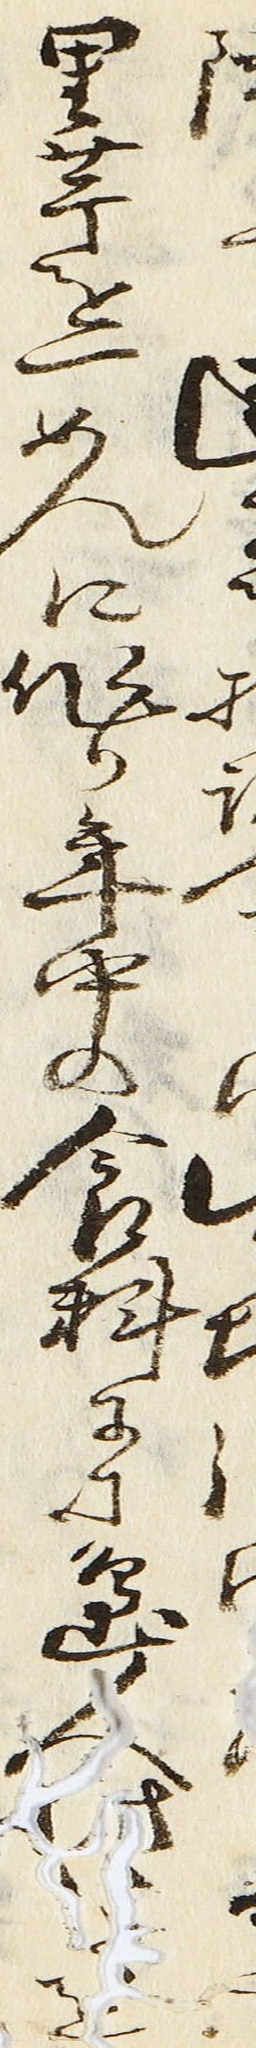里芋を一めんに作り年中の食料にす島人此
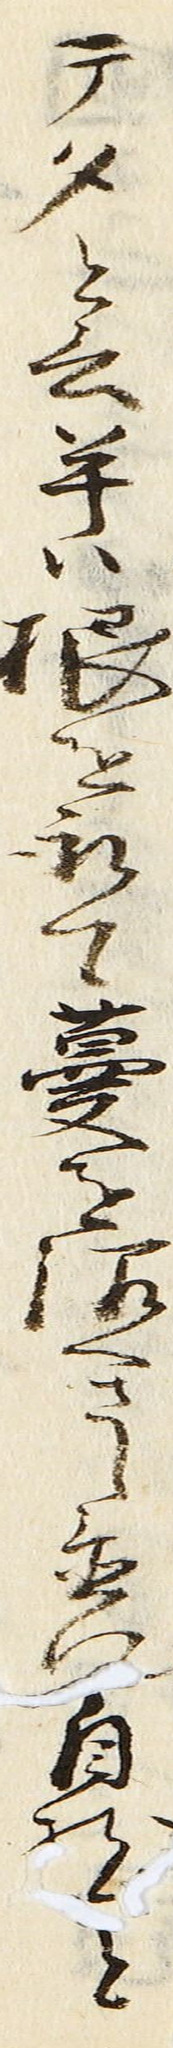テタと言芋ハ根を取て蔓を沼へさし置に自然と
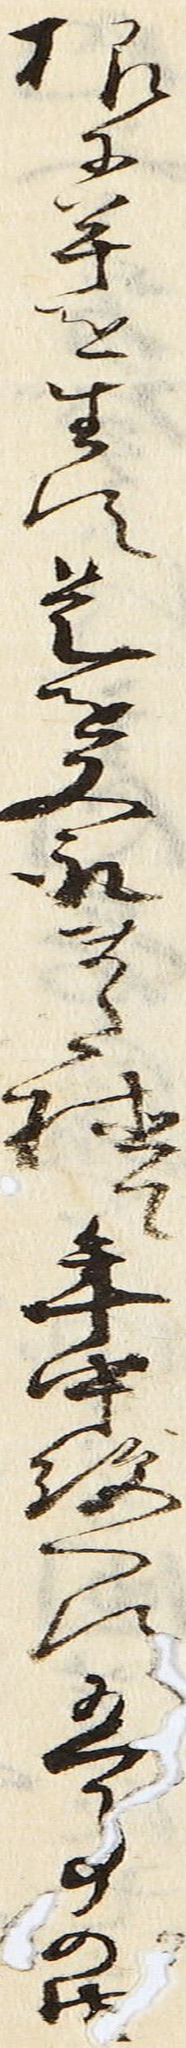根に芋を生す是を又取また植て年中絶へす有事の由
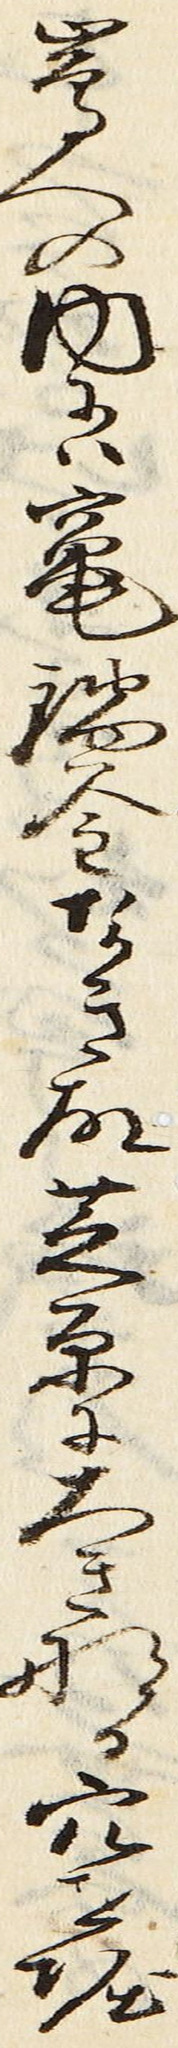島人の内にハ竃鍋釜なき故芝原に大きなる穴を掘
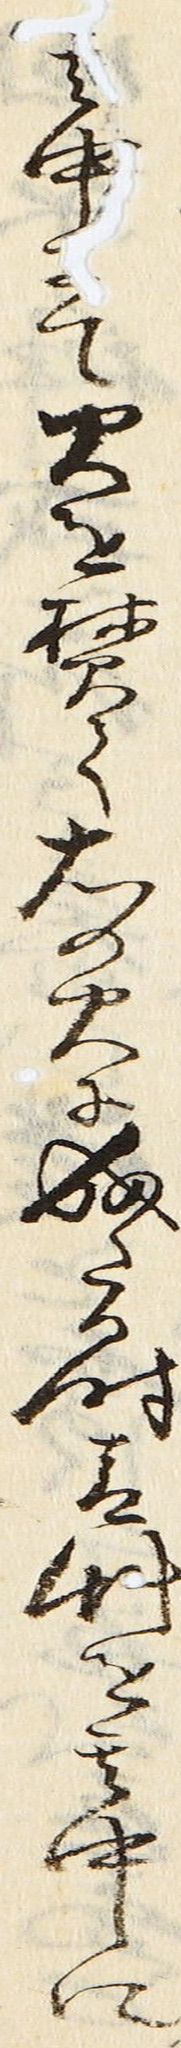其中にて火を焚く右の火に成たる時青艸を其中に
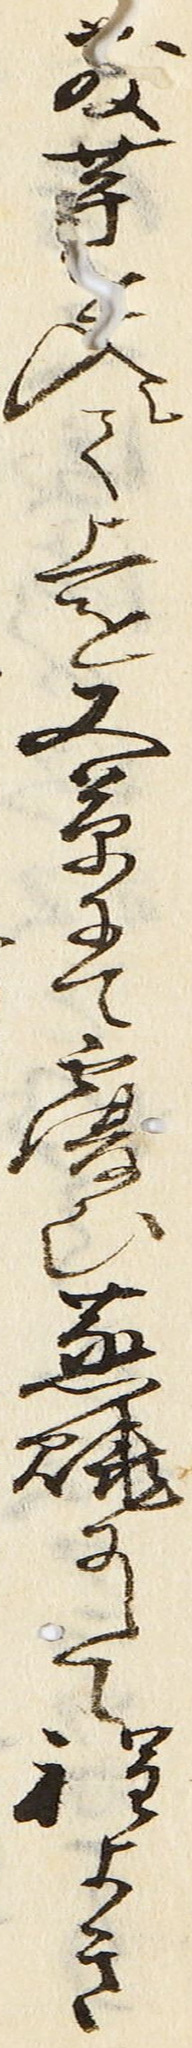敷芋を入レて上を又草にて覆ひ蒸焼にして程よき
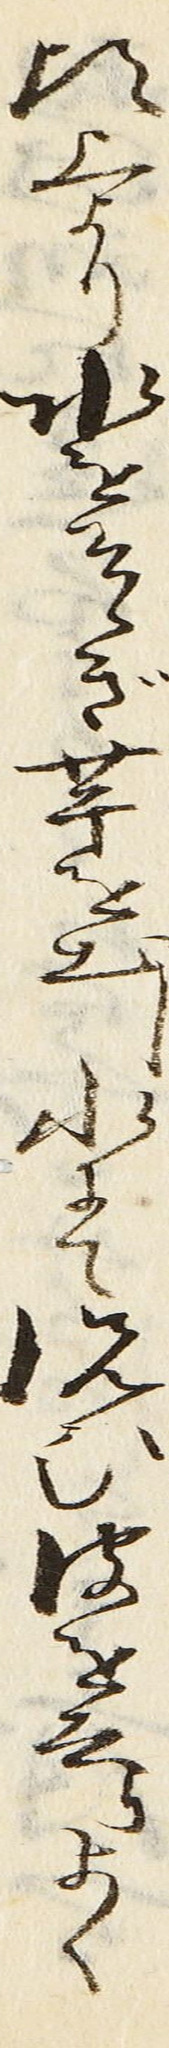頃上より水をそゝぎ芋を出し水にて洗ひ皮を去りよく
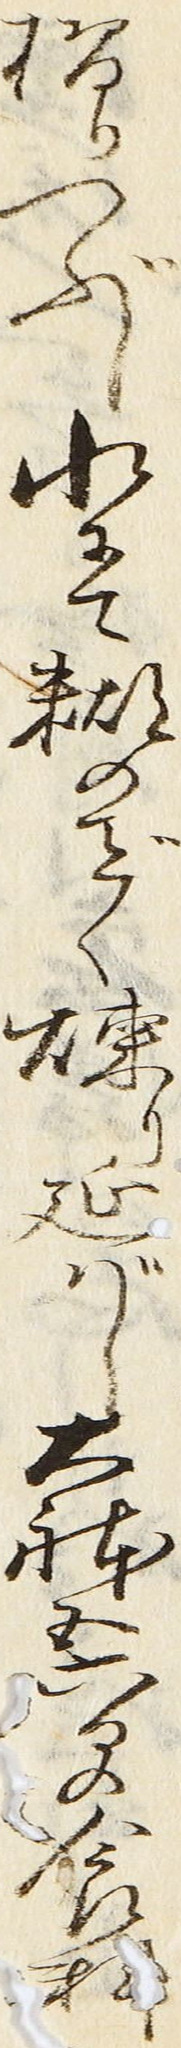摺りつぶし水にて糊のごとく煉り延バし大体五六日の食料
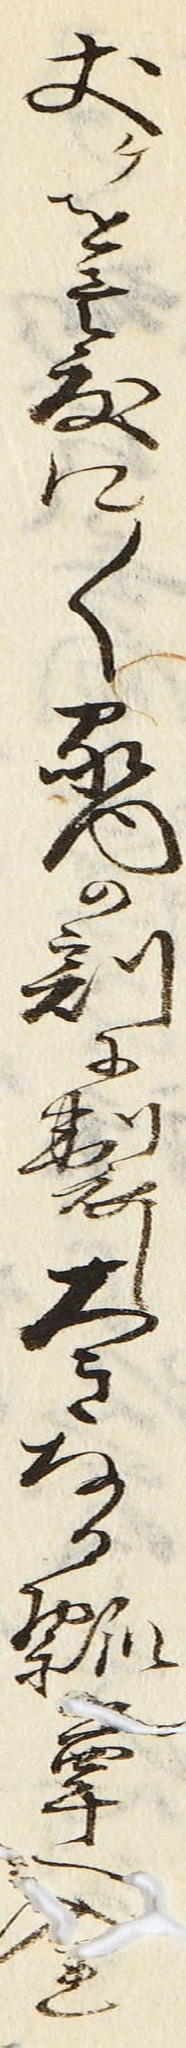丈ケを壱度に〳〵家内の割に製し大きなる瓢箪へ入れ
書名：亜墨利加漂流記聞
